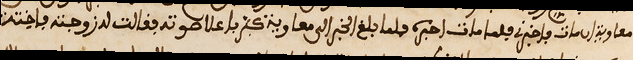معاوية ان مات فاخبرنى فلما مات اخبره فلما بلغ الخبر الى معاوية كبر باعلا صوته فقالت له زوجته فاختة
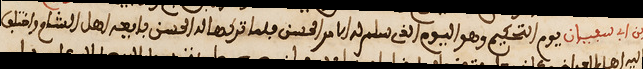بن ابى سفيان يوم التحكيم وهو اليوم الذي سلم له الامر الحسن فلما تركها له الحسن بايعه اهل الشام اختلف
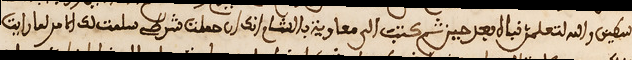سطين والله لتعلمن نباه بعد حين ثم كتب الى معاوية بالشام انك ان حملت شرطى سلمت لك الامر لما رايت
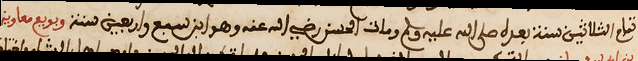تمام الثلاثين سنة بعده صلى الله عليه وسلم ومات الحسن رضي الله عنه وهو ابن سبع واربعين سنة وبويع معاوية
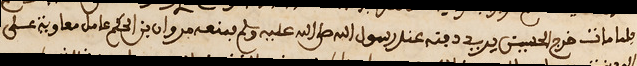فلما مات خرج الحسين يريد دفنه عبد رسول الله صلى الله عليه وسلم فمنعه مروان بن الحكم عامل معاوية على
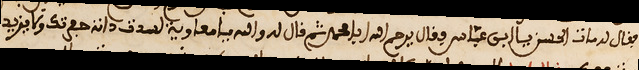فقال له مات الحسن يا ابن عباس فقال يرحم الله ابا محمد ثم قال له الله يا معاوية لسدت داته حفرتك ولايزيد
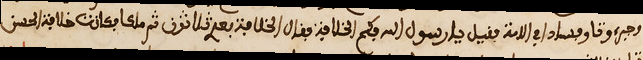وجبرءوتا وفسادا في الامة فقيل يا رسول الله فكم الخلافة فقال الخلافة بعدى ثلاثون ثم ملكا فكانت خلافة الحسن
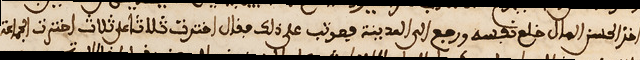اخذ الحسن المال خلع نفسه ورجع الى المدينة فعوتب على ذلك فقال اخترت ثلاثا على ثلاث اخترت الجماعة
